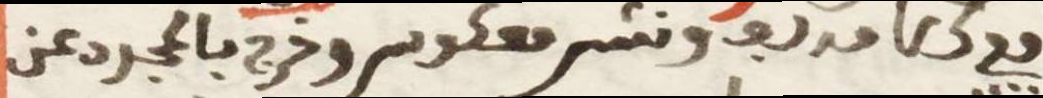ففي كلا مه لف ونشر معكوس وخرج بالمجرد عن
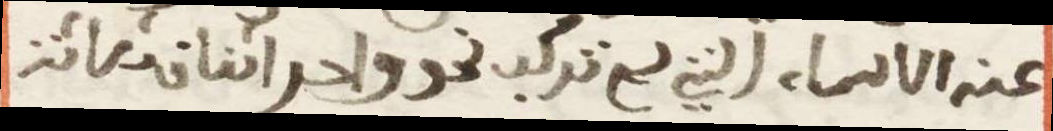عنه الأسماء التي لم تركب نحو واحد اثنان ثلاثة
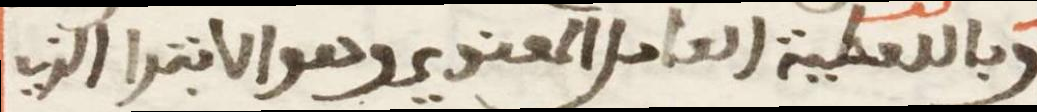وباللفظية العامل المعنوي وهو الابتدا الذي
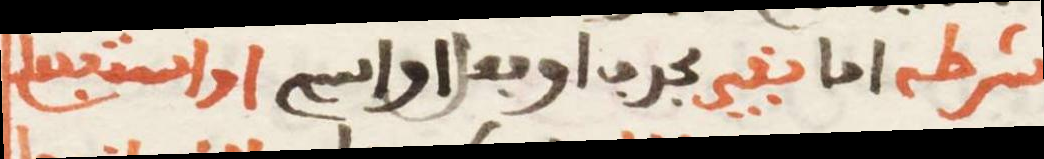شرطه اما بقي بحرف او فعل اواسم او استفهام
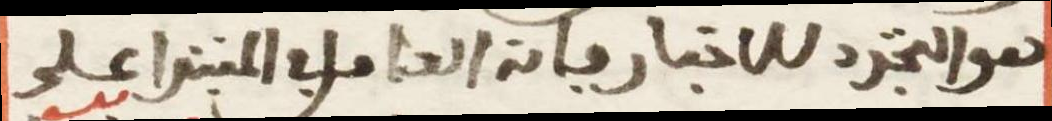هو التجرد للاخبار فانه العامل في المبتدا
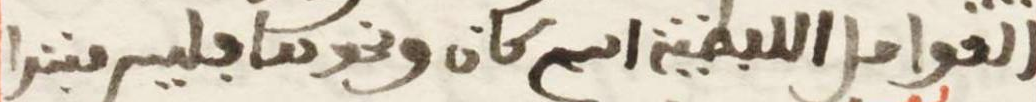العوامل اللفظية اسم كان ونحوها فليس مبتدا
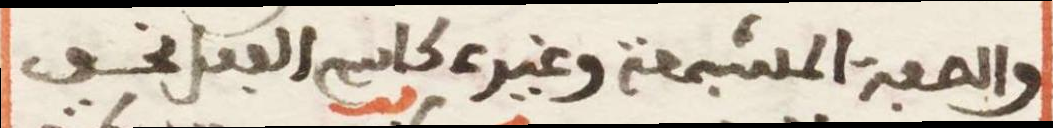والصفة المشبهة وغيره كاسم الفعل نحو
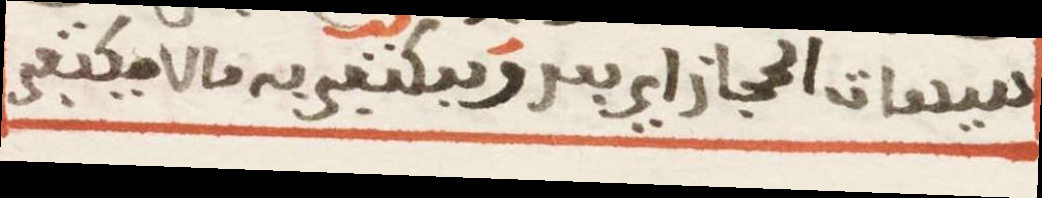سيهات الحجاز أي بعد ويكتفى به مالا يكتفى
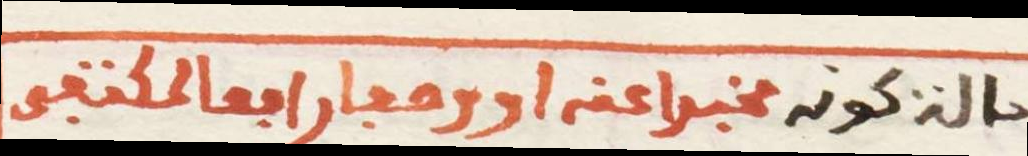حالة كونه مخبرا عنه او وصفا رافعا لمكتفى
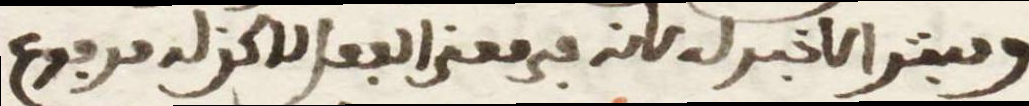ومبتدا لا خبر له لانه في معنى الفعل لكن له مرفوع
